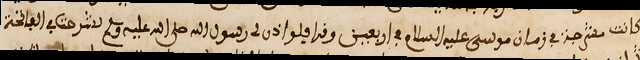كانت مشرجة في زمان موسى عليه السلام في اربعين وقرا فلو اذن لى رسول الله صلى الله عليه وسلم لشرحت في الفاتحة
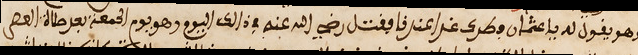وهو يقول له يا عثمان فطرك غدا عندنا فقتل رضي الله عنه في ذلك اليوم وهو يوم الحمعة بعد صلاة العصر
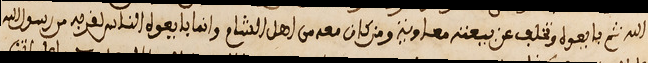الله ثم بايعوه وتخلف عن بيعته معاوية ومن كان معه من اهل الشام وانما بايعوه الناس لقربه من رسول الله
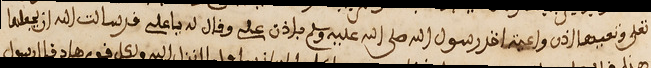تعلى وتعيها اذن واعية اخذ رسول الله صلى الله عليه وسلم باذن على وقال له يا على قد سالت الله ان يجعلها
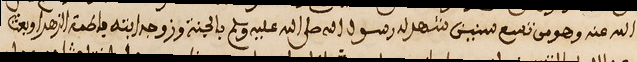الله عنه وهو من تسع سنين شهد له رسول الله صلى الله عليه وسلم بالجنة وزوجه ابته فاطمة الزهرا و بعث
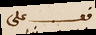قف على
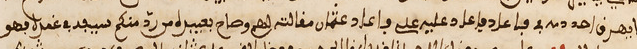لايهرق احد دمه في فاعاد فاعاد عليه على فاعاد عثمان مقالته لهم وصاح بعبيده من رد منكم سيفه في غمده فهو
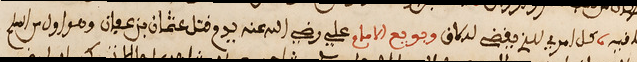لا فيه كل امري للذي يقضى له لاق وبويع الامام علي رضي الله يوم قتل عثمان بن عفان وهو اول من اسلم
